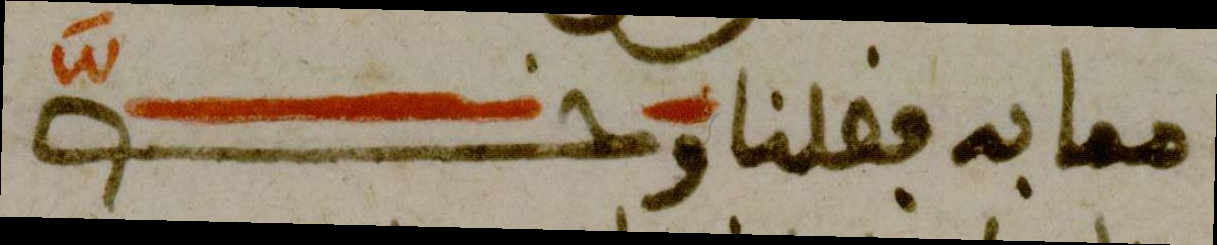َّمما به فضلنا وَخَص
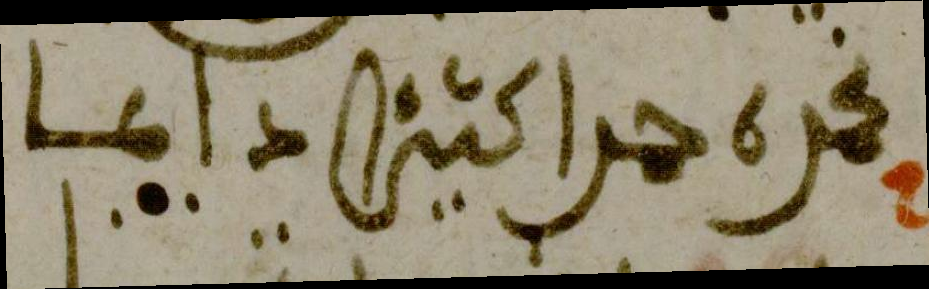نحمده حمدا كثيرا دائما
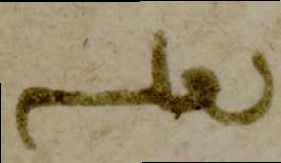لعلم
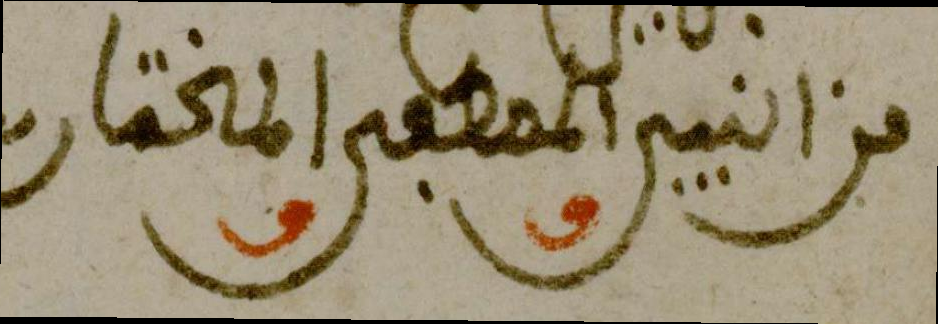من النبي المصطفى المختار
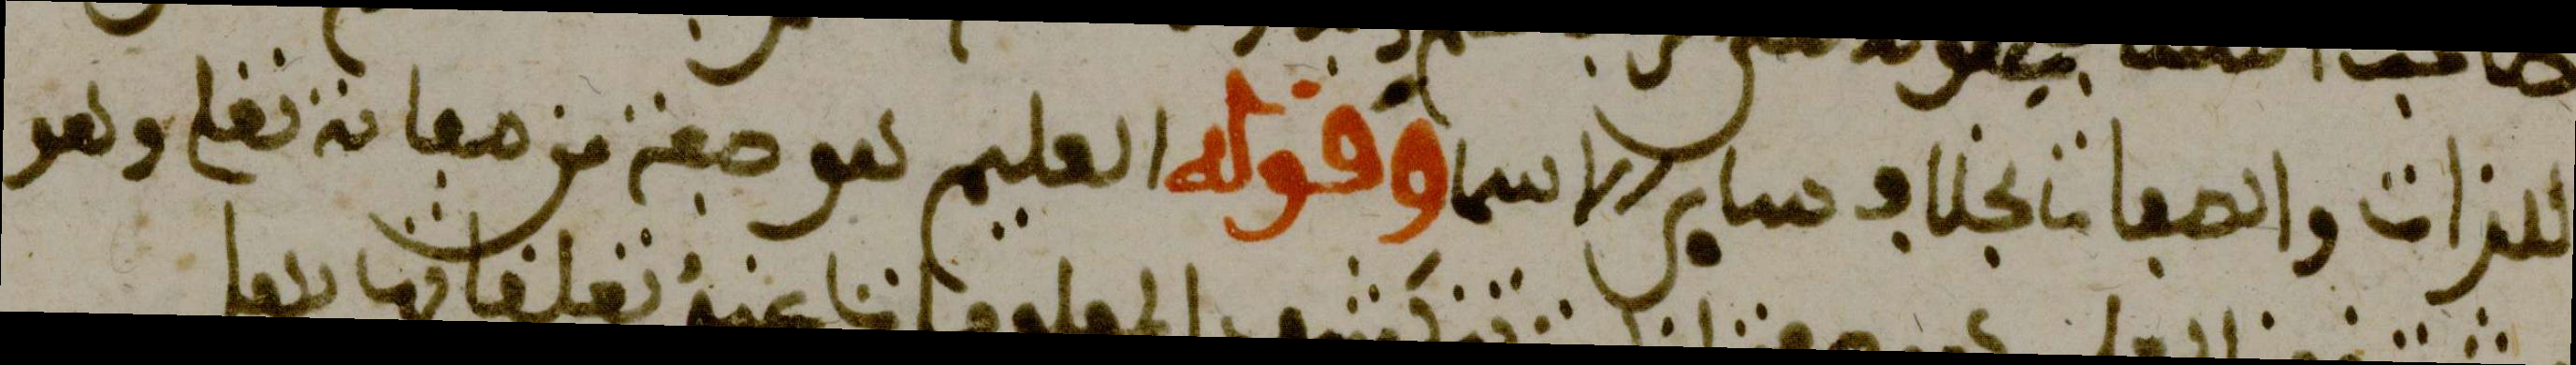للذات والصفات بخلاف سائر الاسماء وَقوله العليم هو صفة من صفاته تعلى وهو
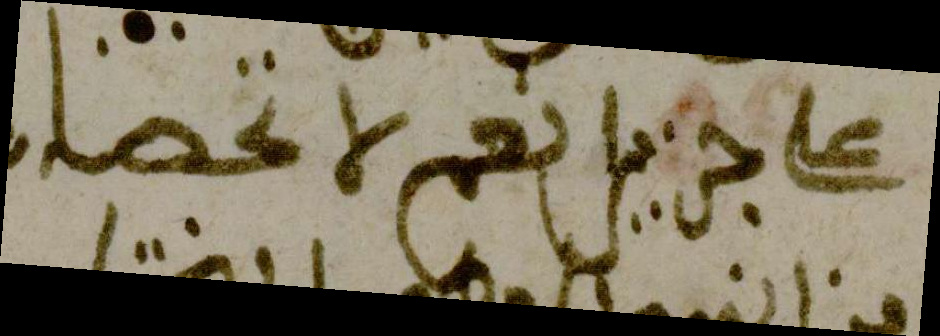على جزيل نعم لا تحصا
